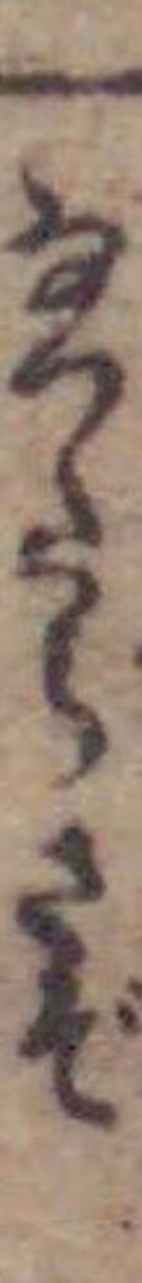なつたらさぞ
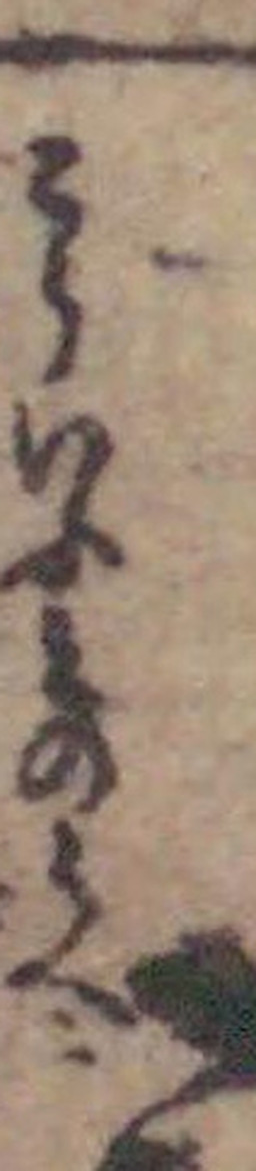こういふみのうへに
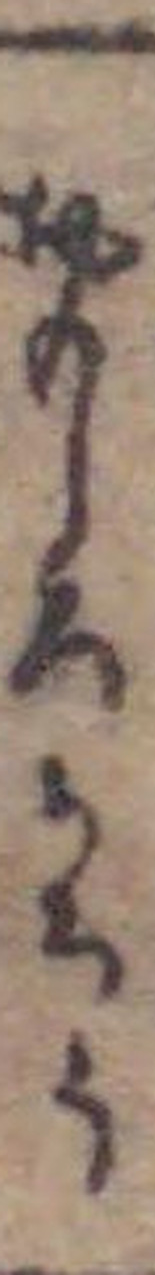おもしろかろう
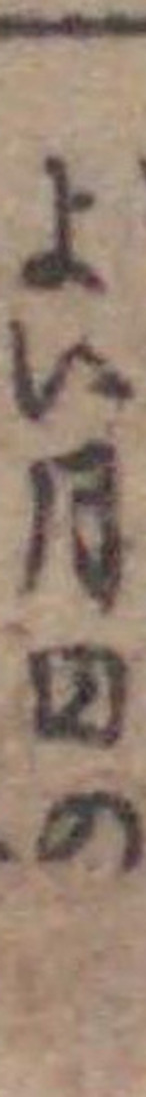よい月日の
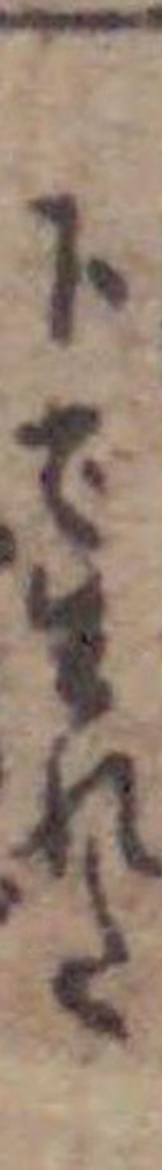下で生れた
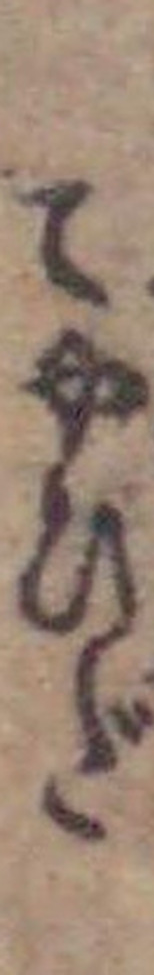てやひだ

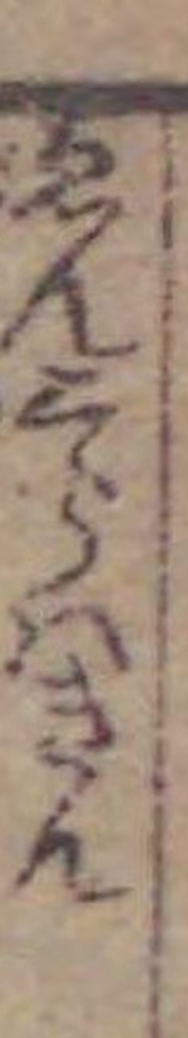ゑん二郎はきん
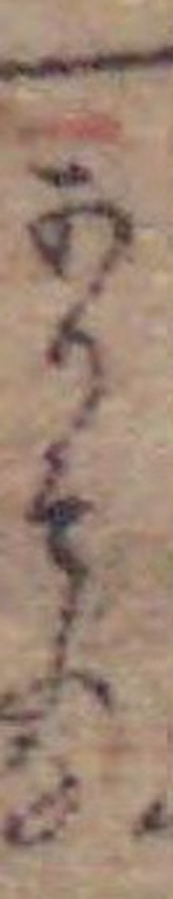ありそふな
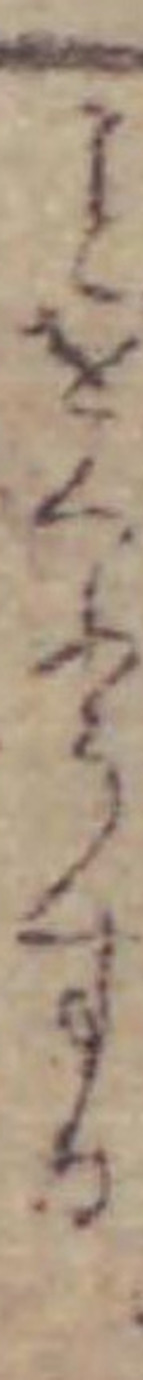ことをくふうする
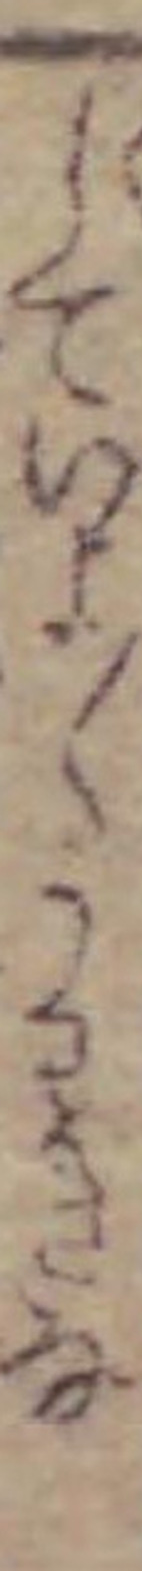していよ〳〵うわきな
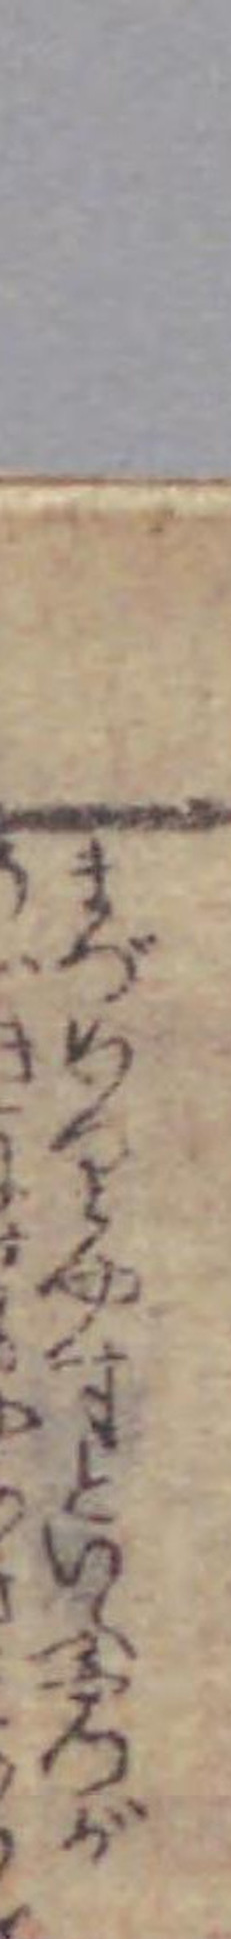まづめりやすといふやつが
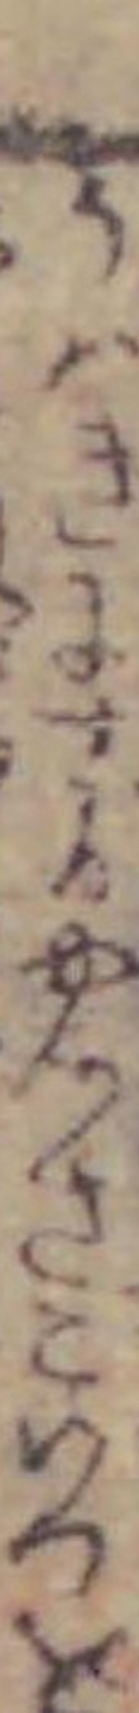うはきにするやつさこいつを
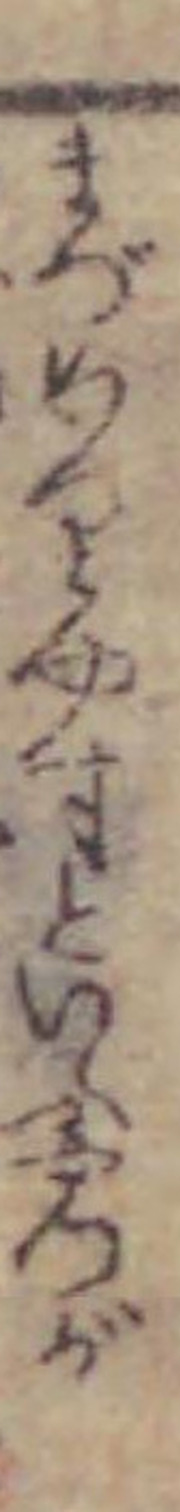まづめりやすといふやつが
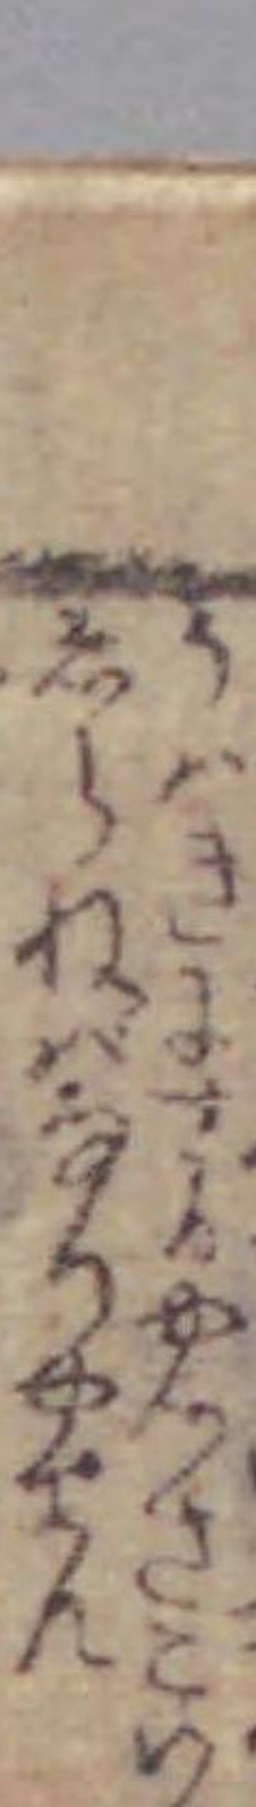しらねばなりやせん
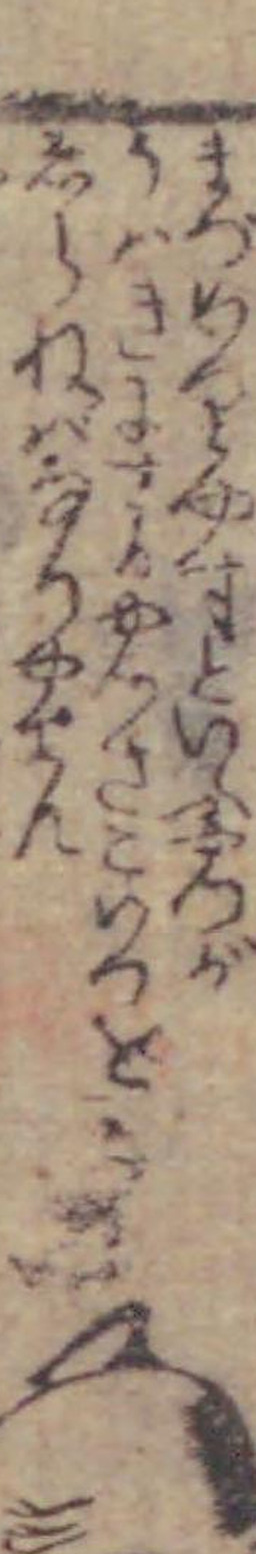しらねばなりやせん
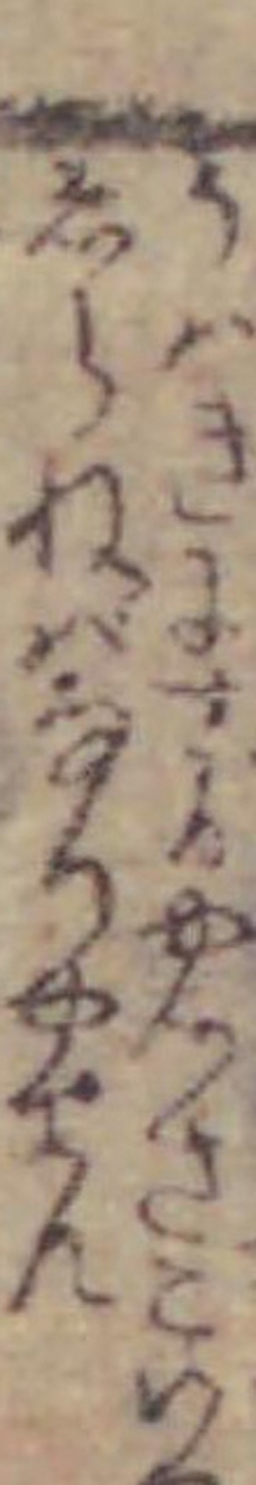しらねばなりやせん
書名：江戸生艶気樺焼 : 3巻
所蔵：国立国会図書館 National Diet Library, JAPAN
